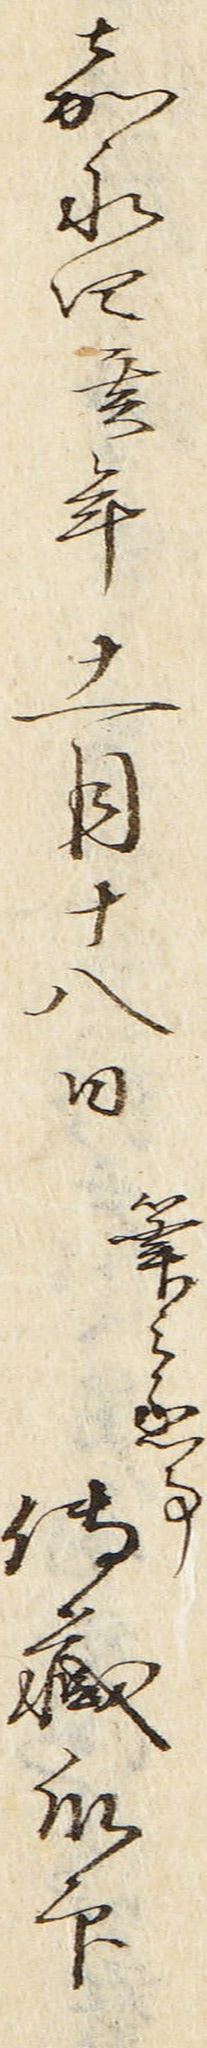嘉永四亥年十一月十八日筆之丞事
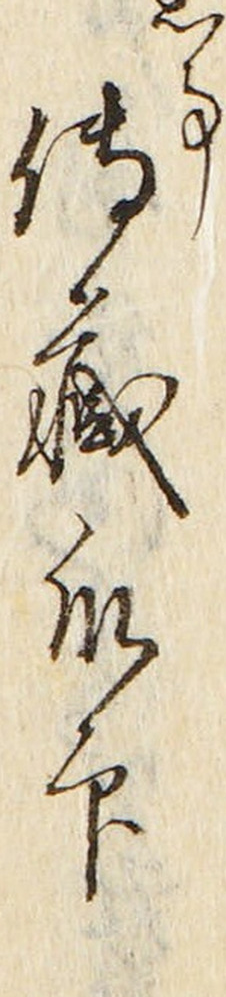伝蔵爪印
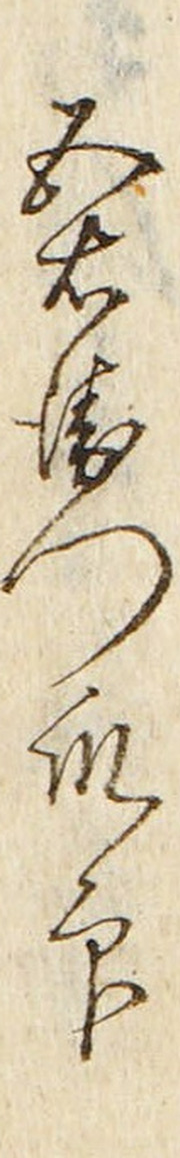五右衛門爪印

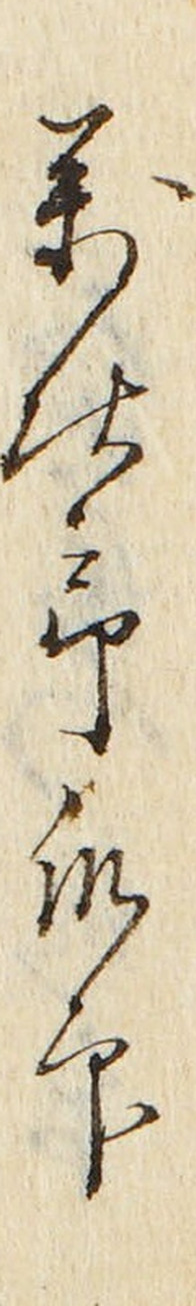万次郎爪印
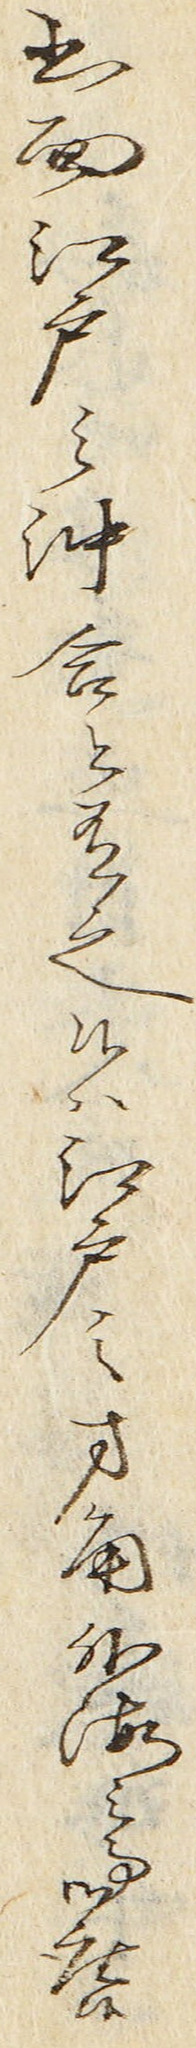書面江戸之沖合と有之候は江戸之方角外海之事御座候
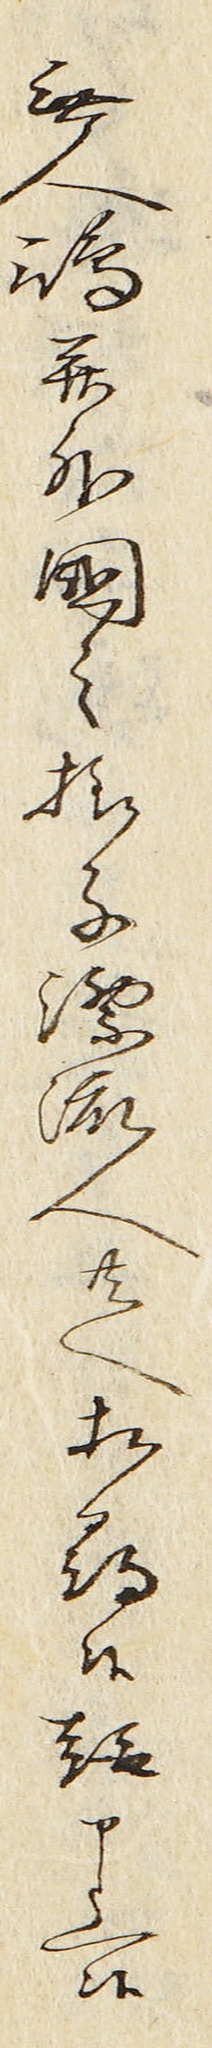無人嶋并外国之様子漂流人共へ相尋候趣申上候
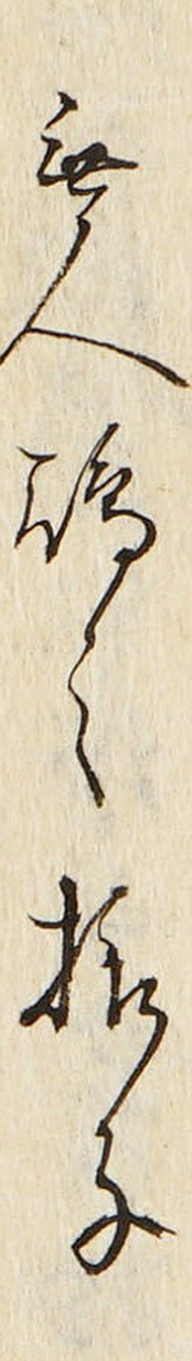無人嶋之様子
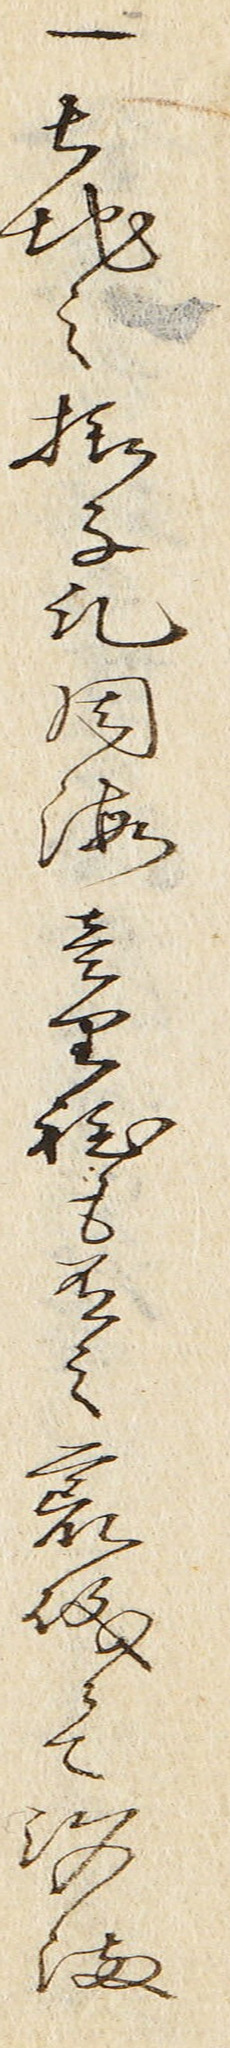一土地之様子凡周海壱里程も有之荒礒にて汐満
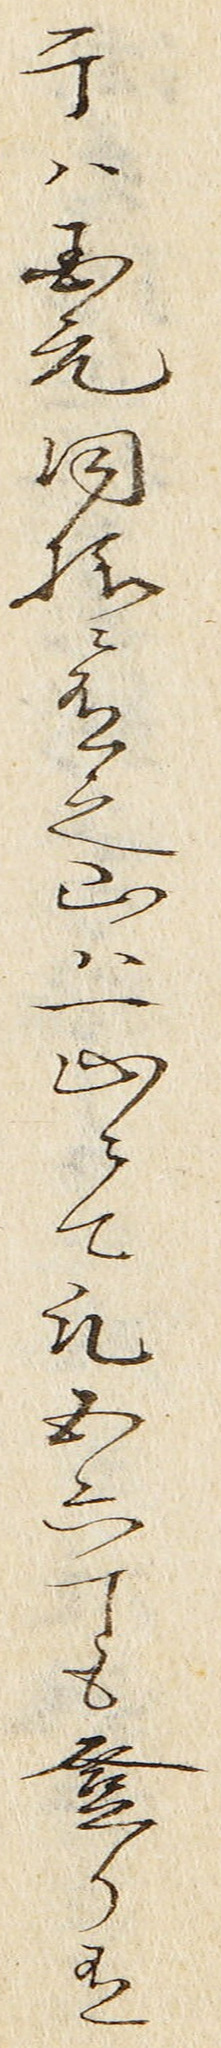干は国元同様に有之山は一山にて凡五六丁も登り有
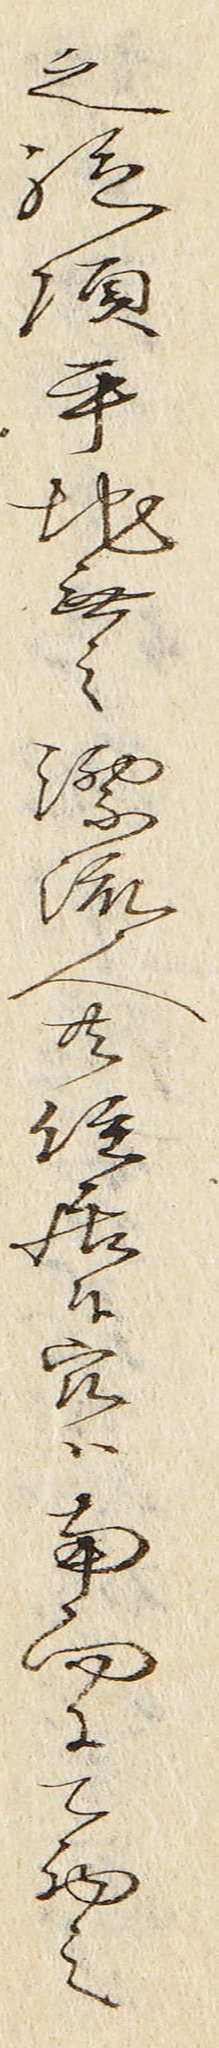之絶頂平地無之漂流人共住居候穴は南向にて西之
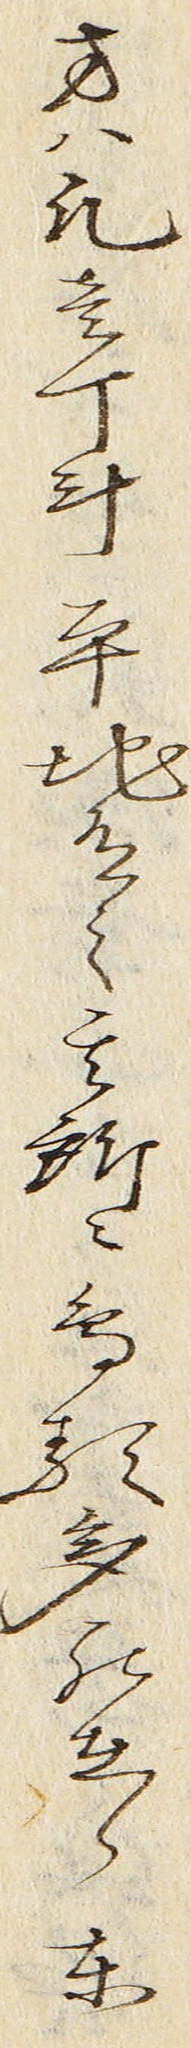方は凡壱丁計平地有之其所に鳥類多罷在り東
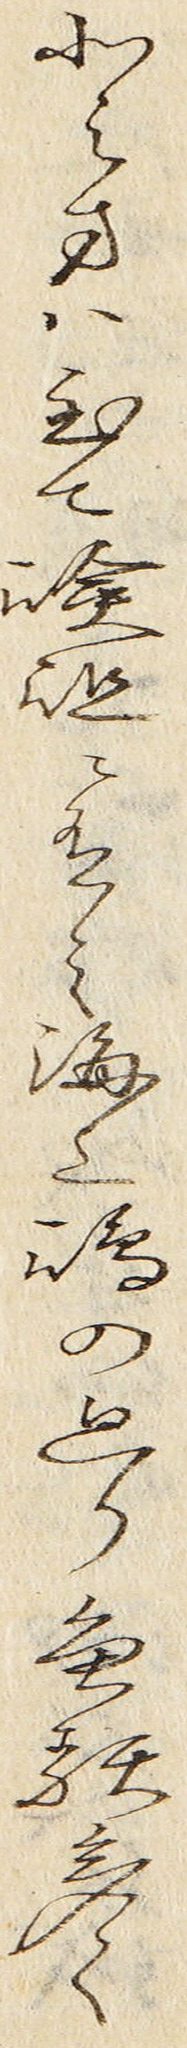北之方は至て険阻に有之海上嶋の廻り魚類多く
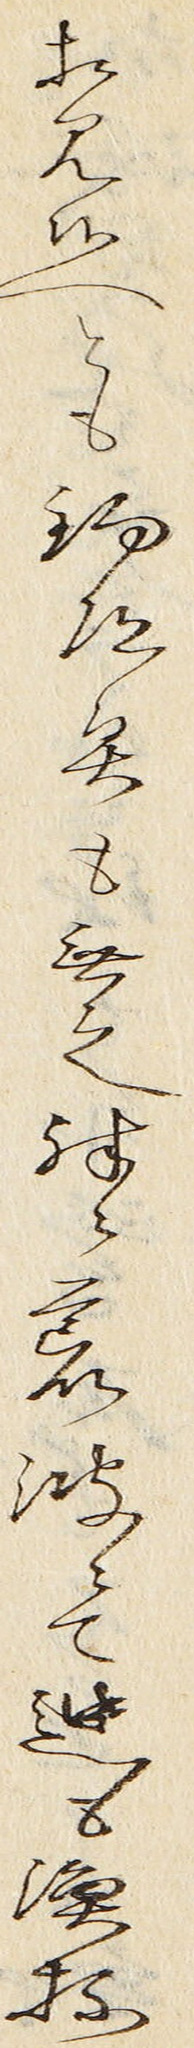相見候へとも釣道具も無之殊に荒波にて迚も漁抔
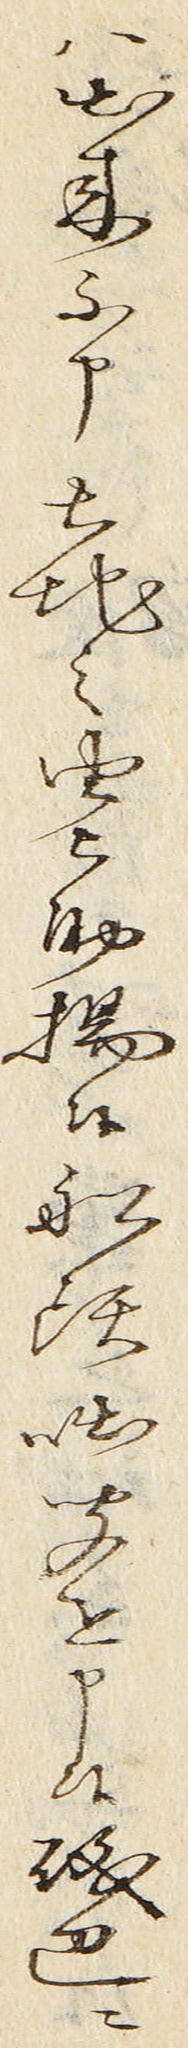は出来不申土地之由被助揚候船頭咄聞せ申候礒辺に
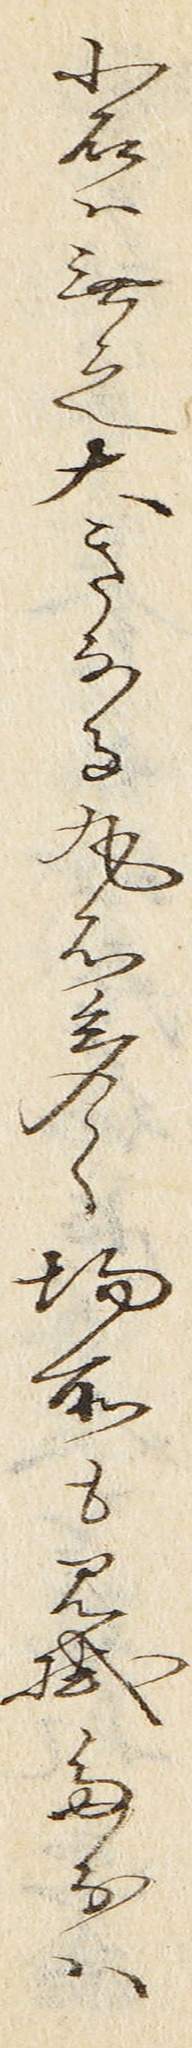小石は無之大きなる丸石多く場所も見掛多分は
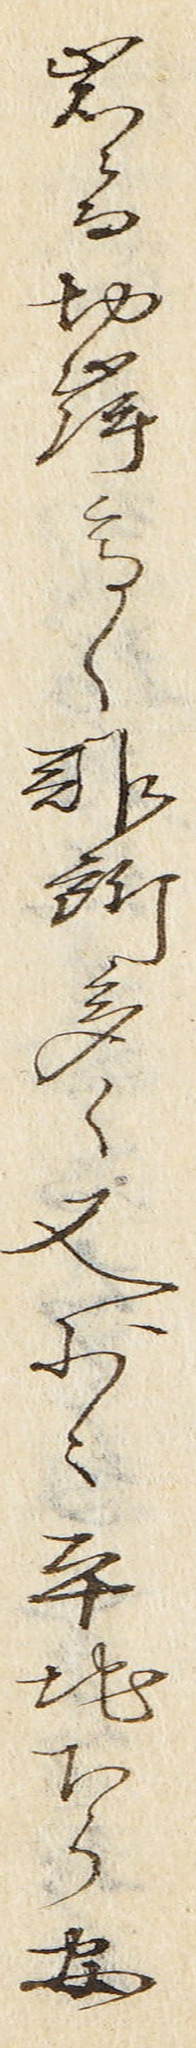岩に而切岸高く難所多く又少々平地下り安
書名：土佐中浜万次郎漂流記
